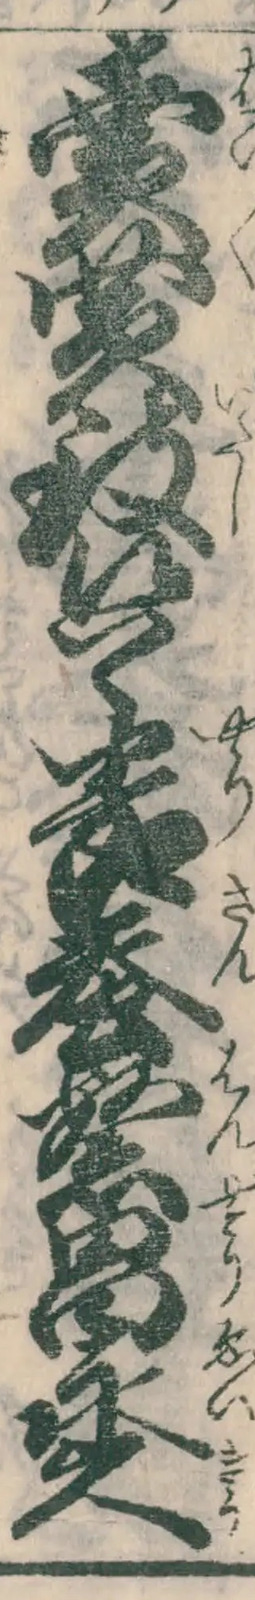売買致候て養蚕繁昌永久

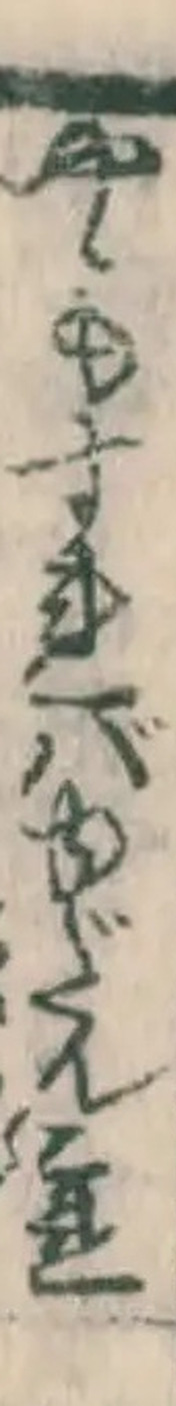ややもすればゆだんこれ
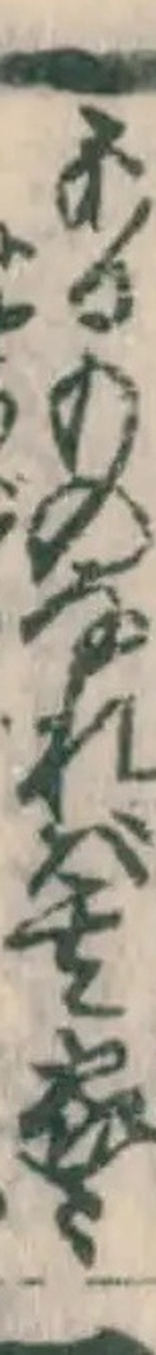あるものなれば其家〻
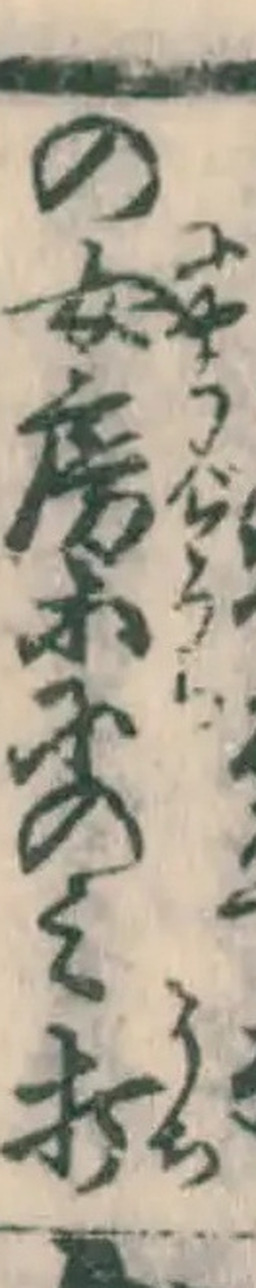の女房等にのみ打
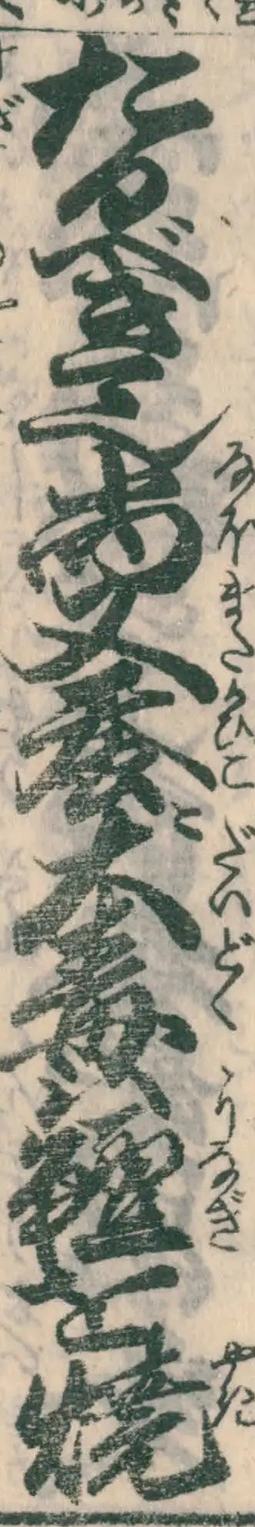たるべき也尚又蚕に大毒は鰻を焼
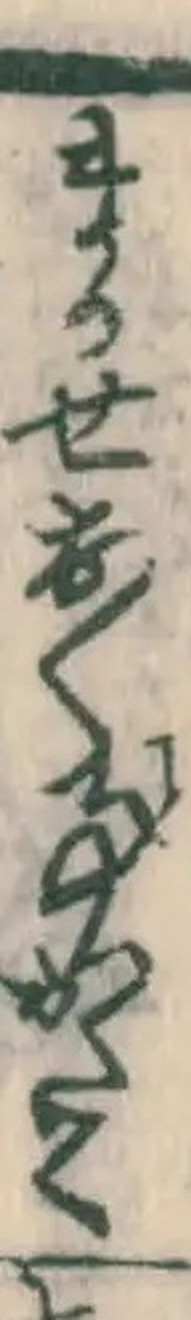まかせおく事かたく
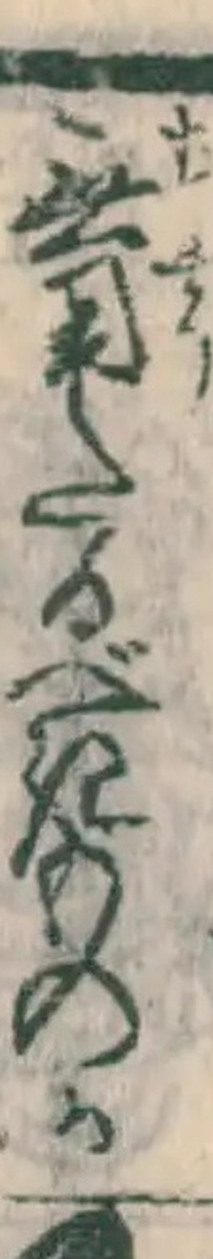無用たるべきものか
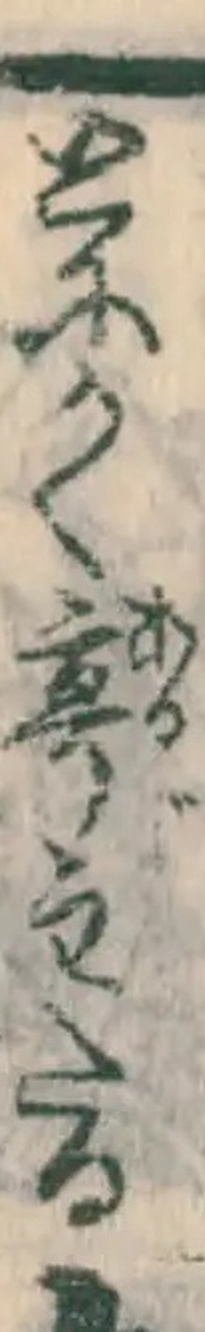とにかく亭主たる
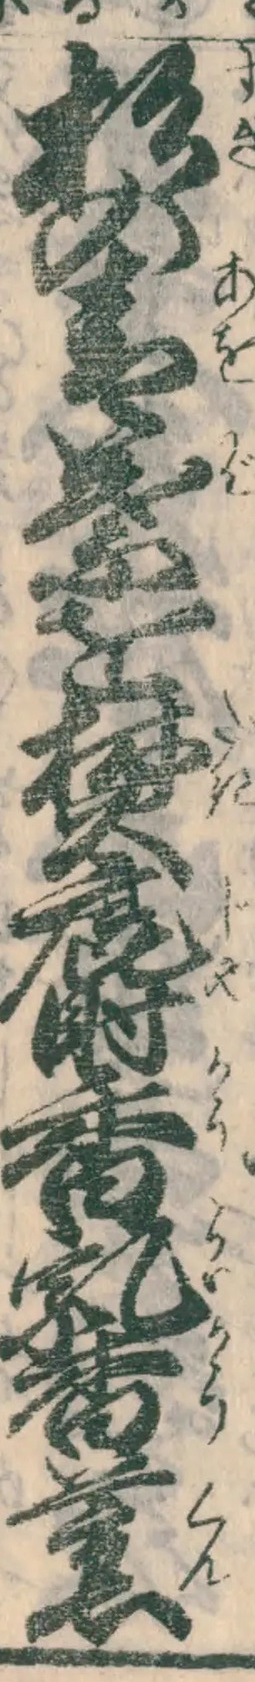杉の青葉を焚麝香乳香薫
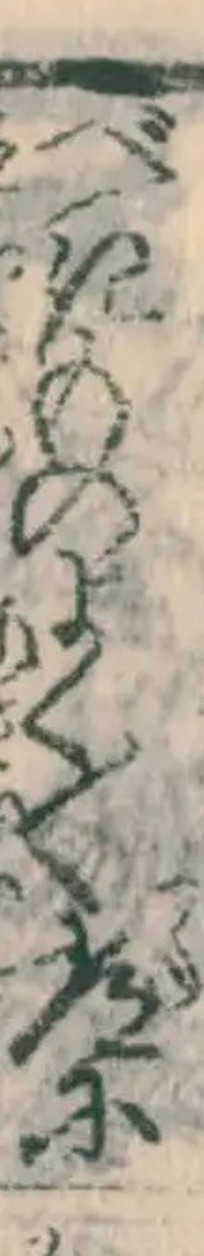べきものよく〳〵常に
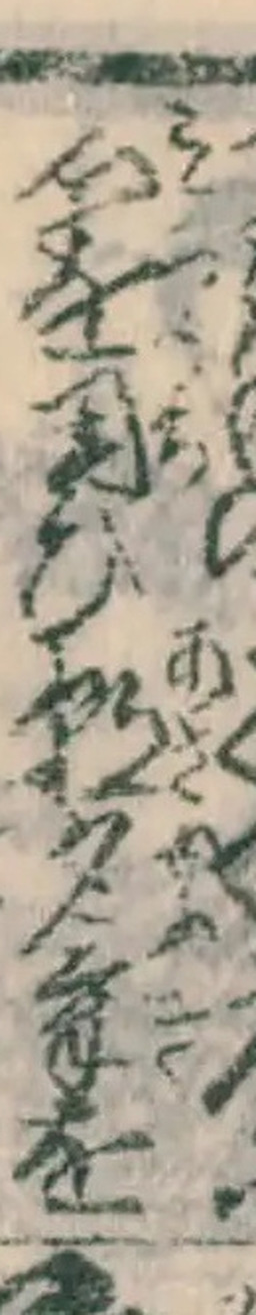心を用ひ朝夕気を
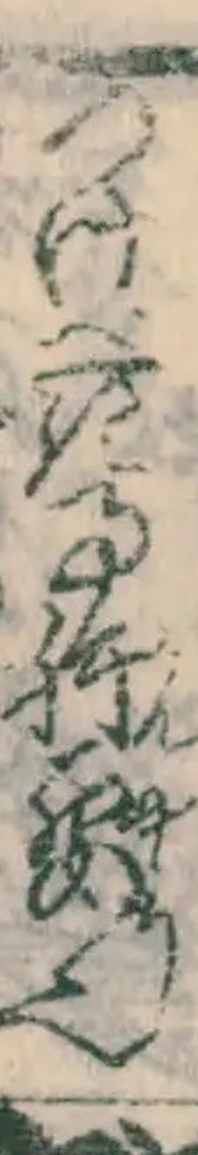つけべき事肝要也
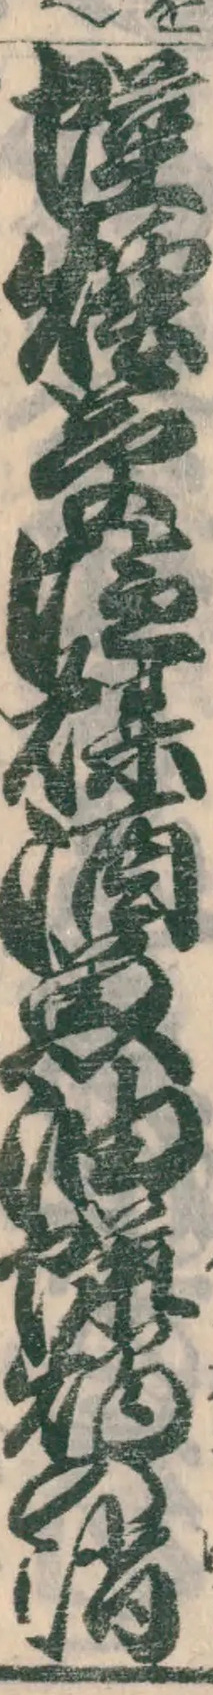陸煙草塩煤酒魚油蝋燭の消
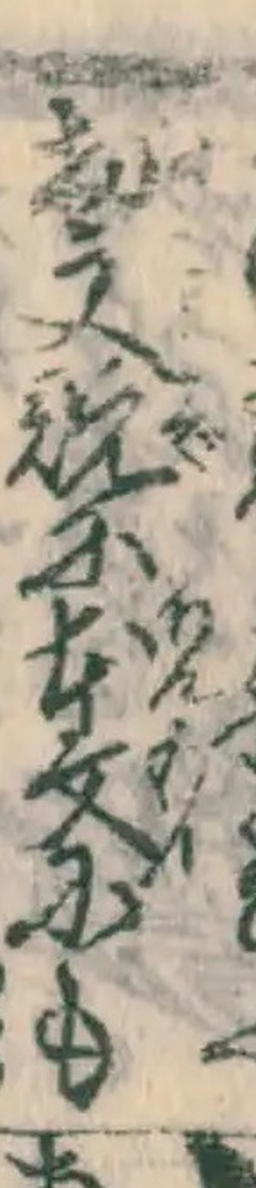扨又既に本文にも
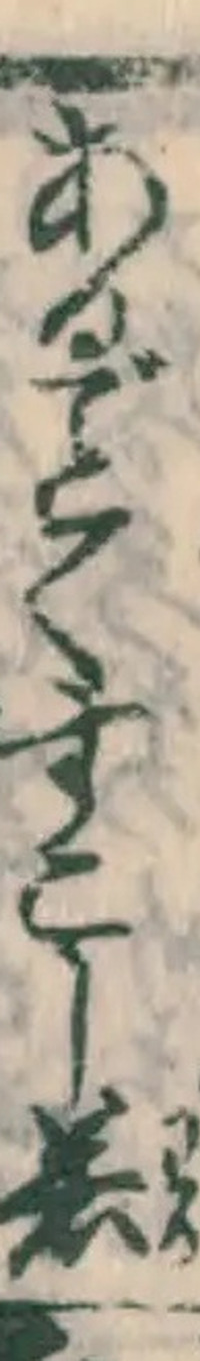あるごとくすこし若
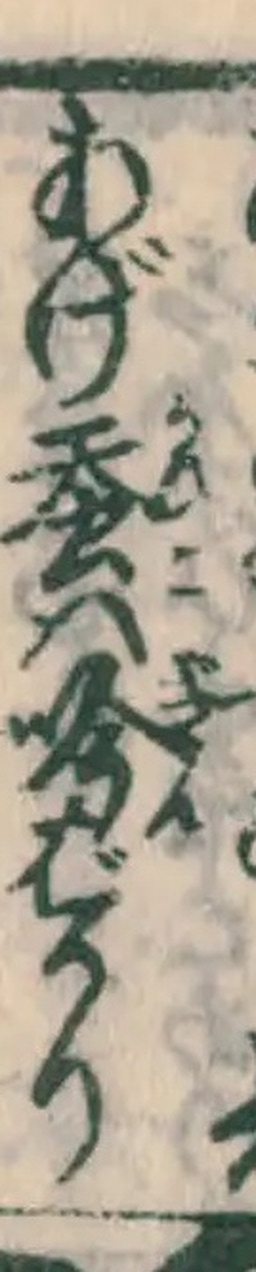あげ蚕は吟ばかり
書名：養蚕往来
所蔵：国立国会図書館 National Diet Library, JAPAN
